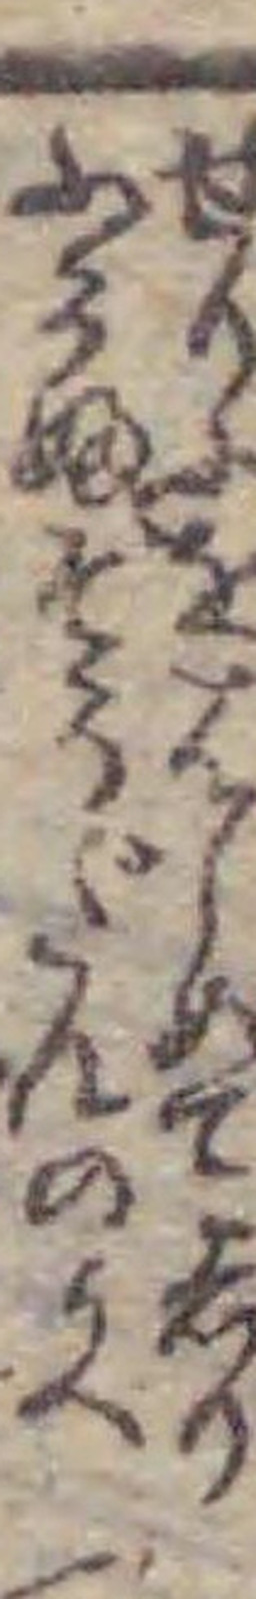ふうふそうだんのうへ
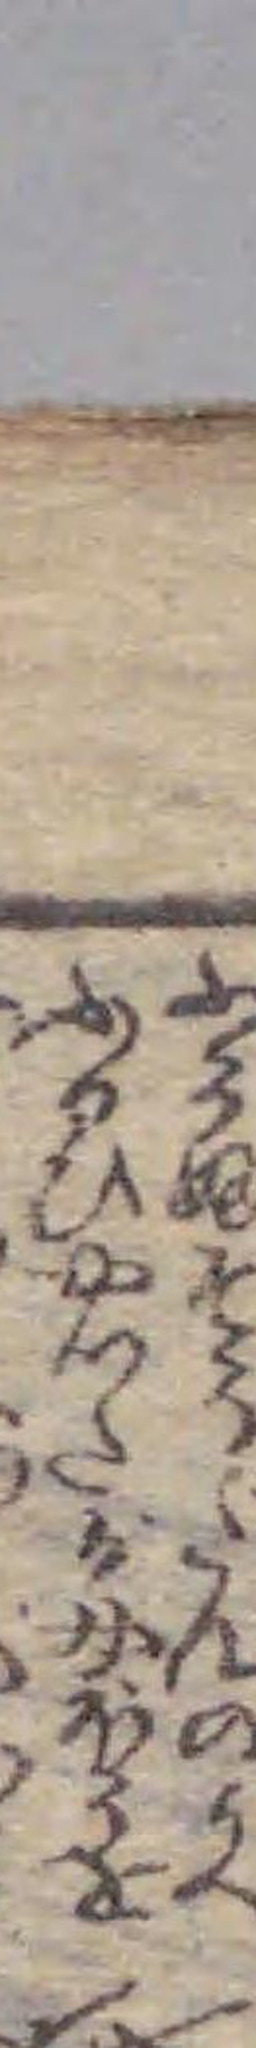ふるひやつたが女ぼうを
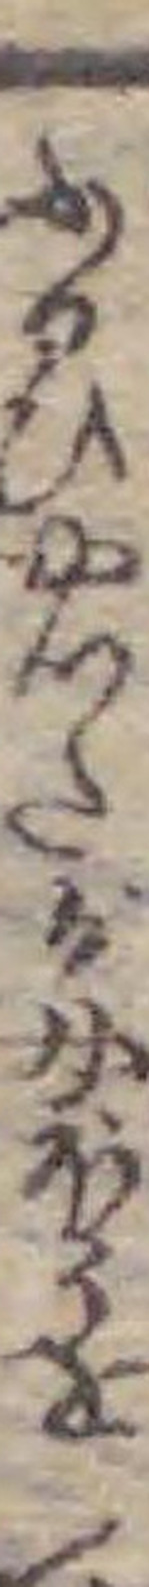ふるひやつたが女ぼうを
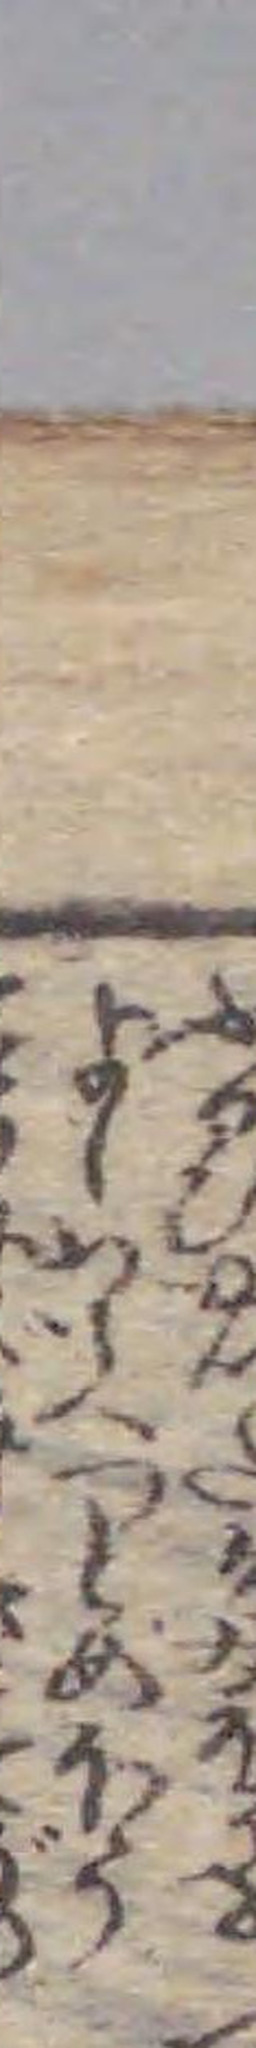よしはらへつとめほう
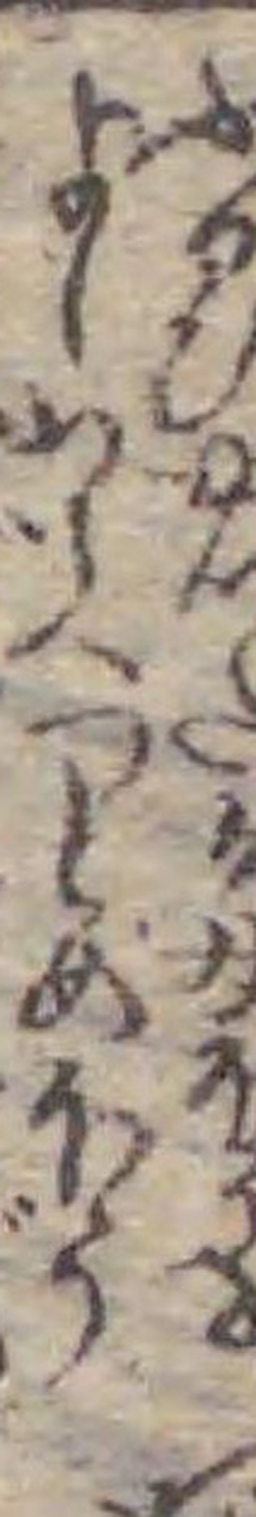よしはらへつとめほう
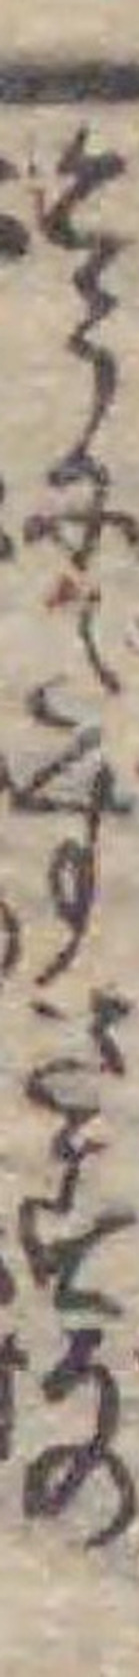こうにだすさすがの
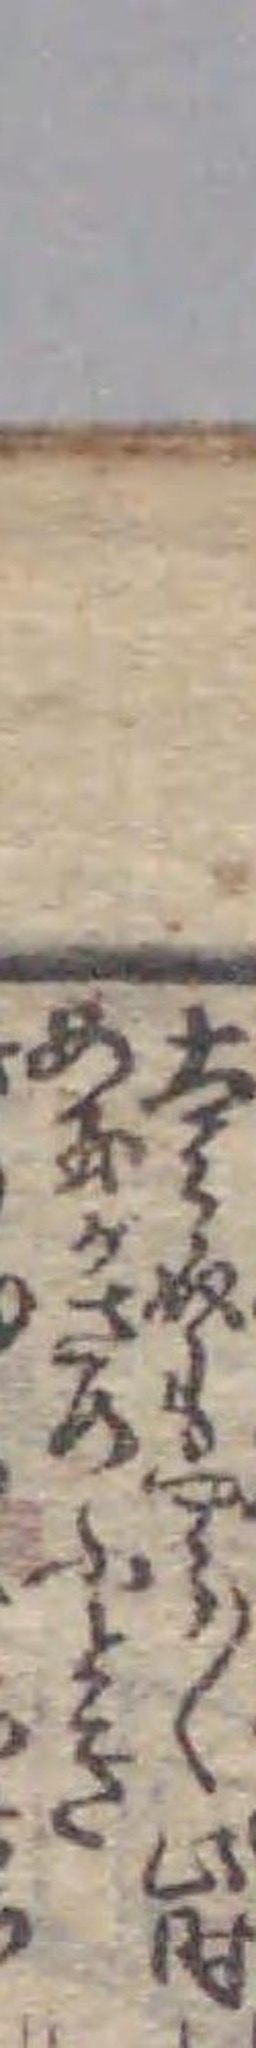め玉がさめふとき
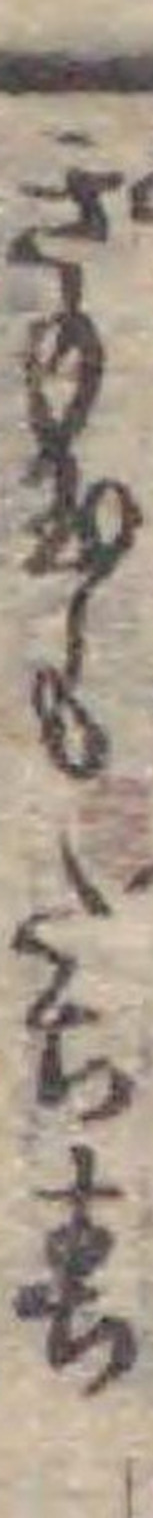きも玉もたちまち
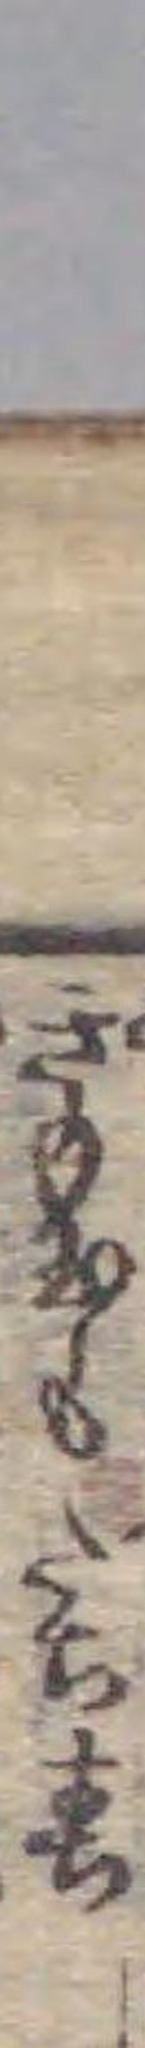きも玉もたちまち
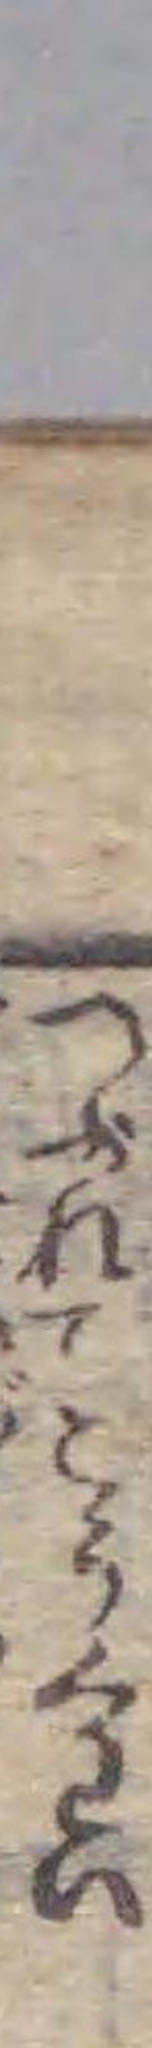つぶれてこうくわい
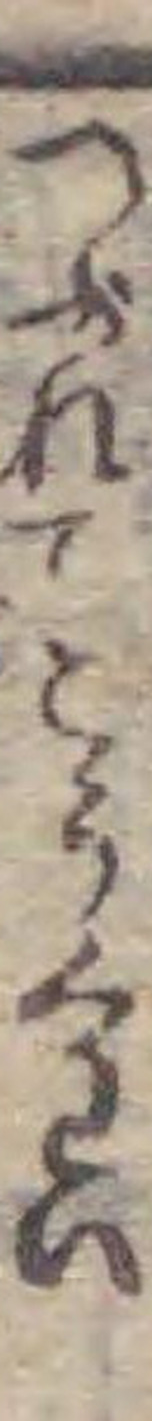つぶれてこうくわい
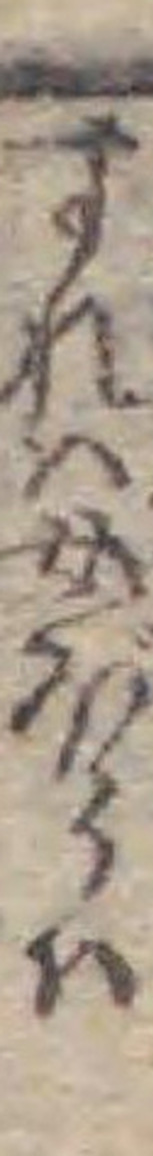すれは女ぼうは
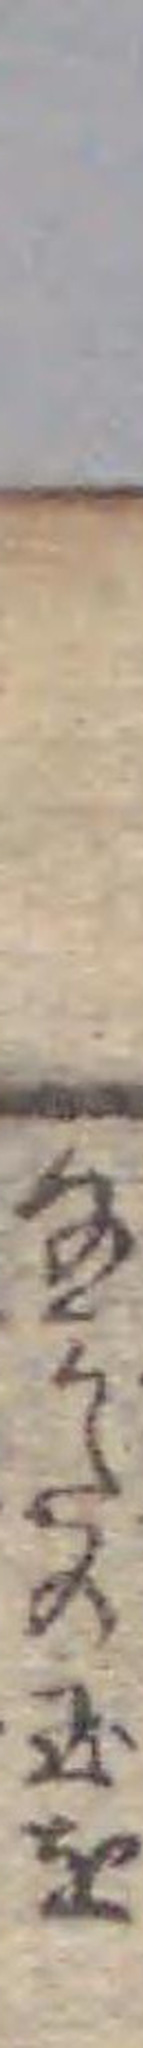なみたの球を
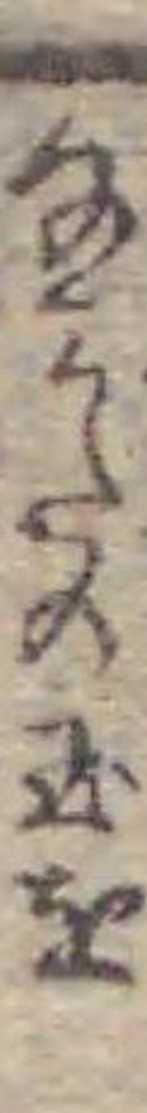なみたの球を
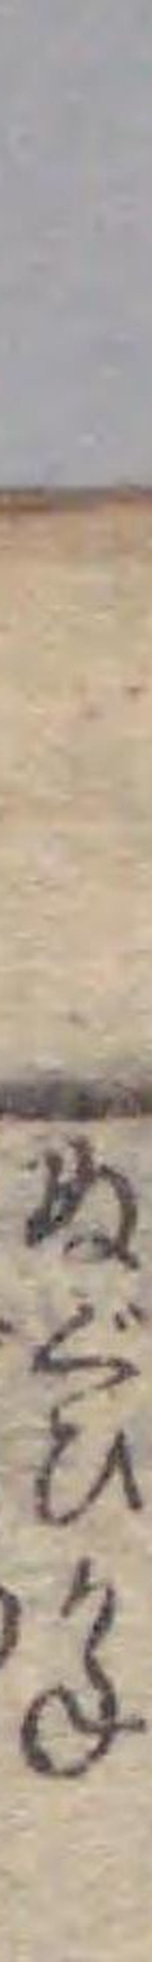ぬぐひかね
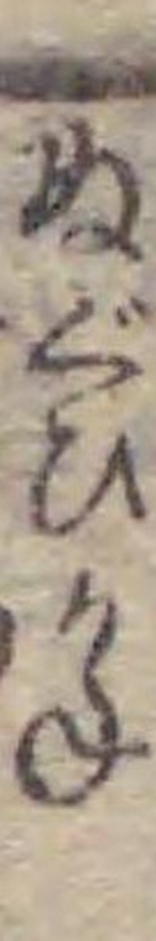ぬぐひかね
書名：四遍搨心学草帋 : 3巻
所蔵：国立国会図書館 National Diet Library, JAPAN
